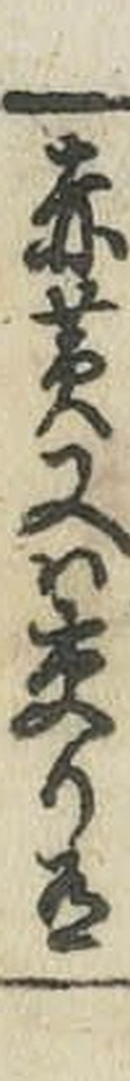赤黄又は交り有
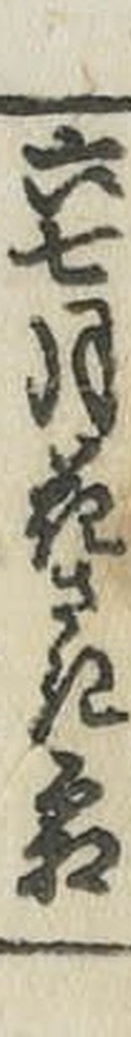六七月花さき霜
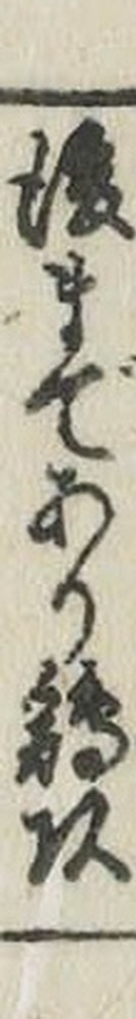後まであり鶏頭
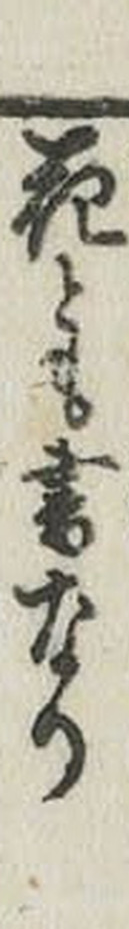花とも書なり
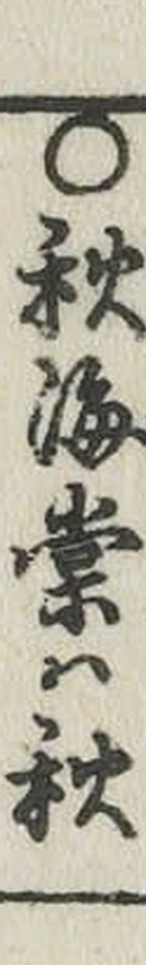○秋海棠は秋
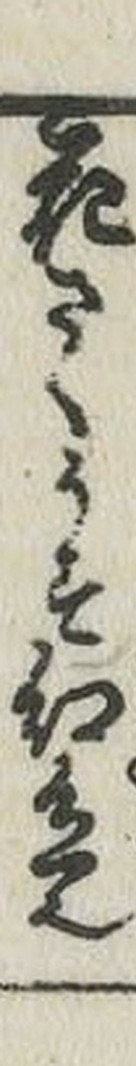花さくうす紅色也
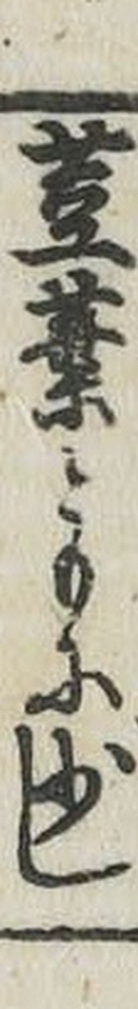茎葉ともに少し

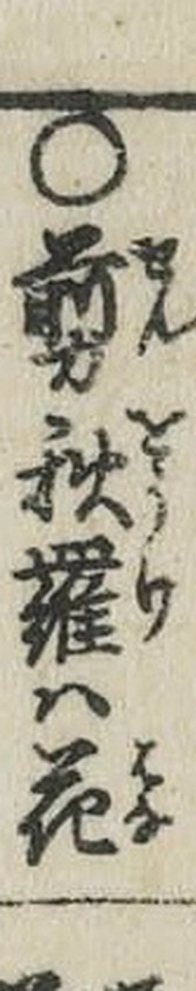○剪秋羅は花
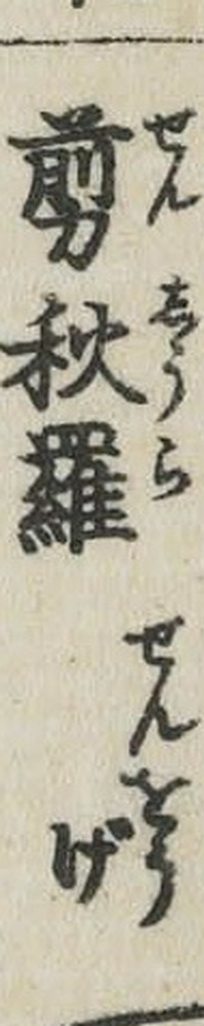剪秋羅せんをうげ
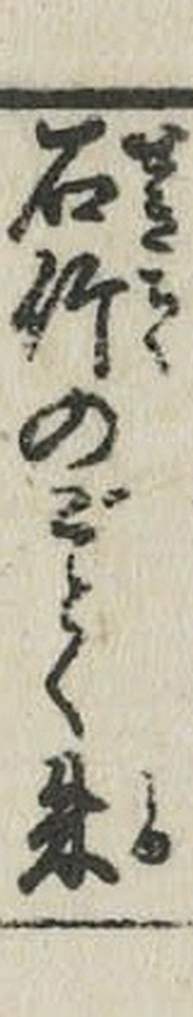石竹のごとく朱
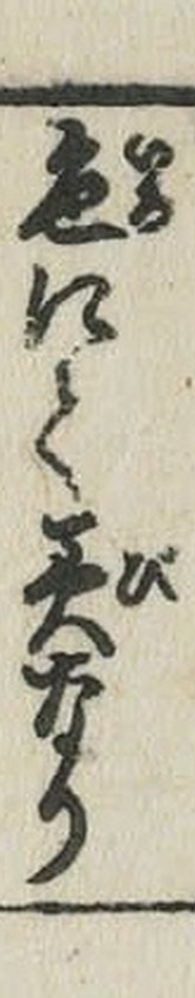色にて美なり
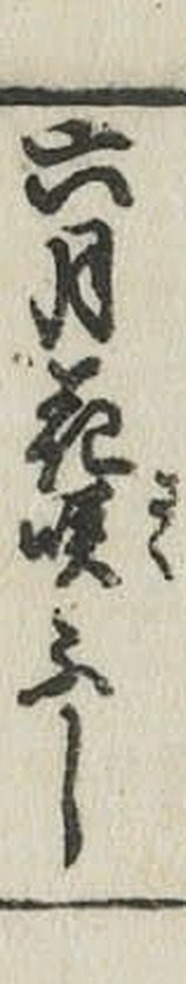六月花咲ふし
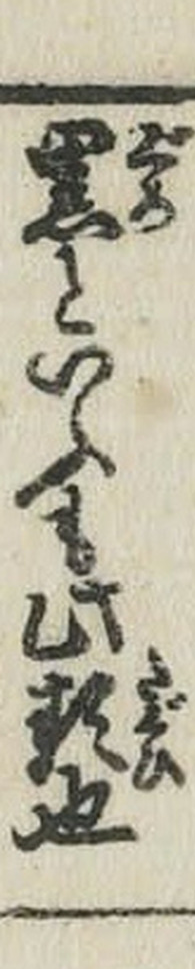黒といふも此類也
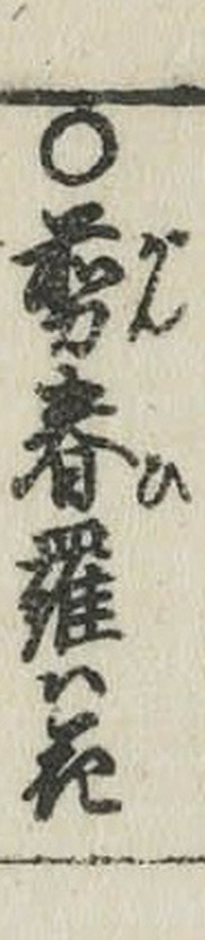○剪春羅は花
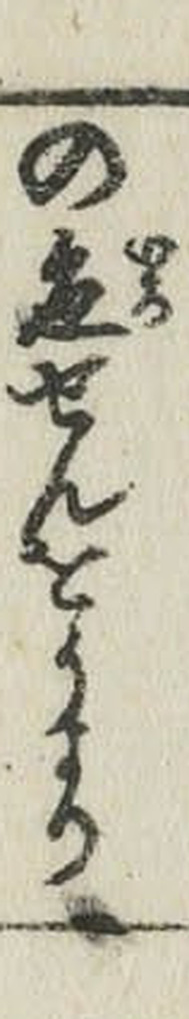の色せんをうより
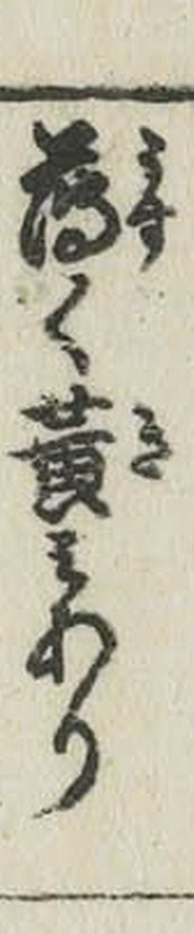薄く黄みあり
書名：増補頭書訓蒙図彙大成 10巻 9:巻之20
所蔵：東京学芸大学教育コンテンツアーカイブ
